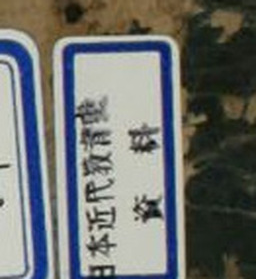日本近代教育史

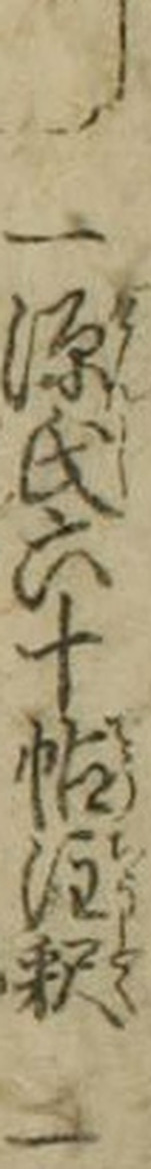一源氏六十帖注釈
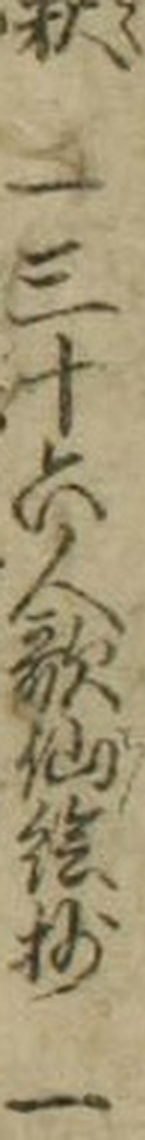一三十六人歌仙絵抄
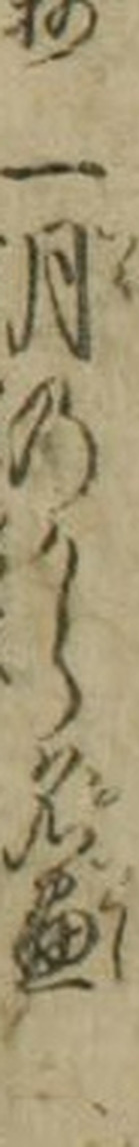一月のから名尽
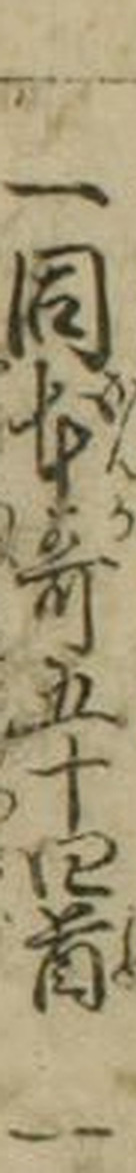一同本哥五十四首
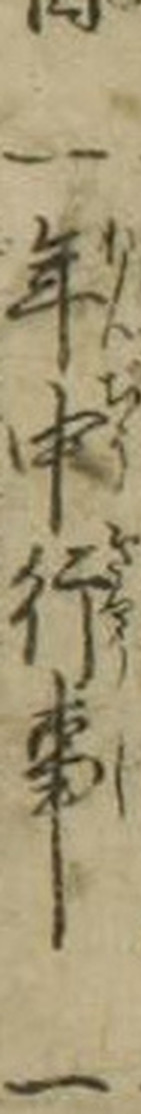一年中行事
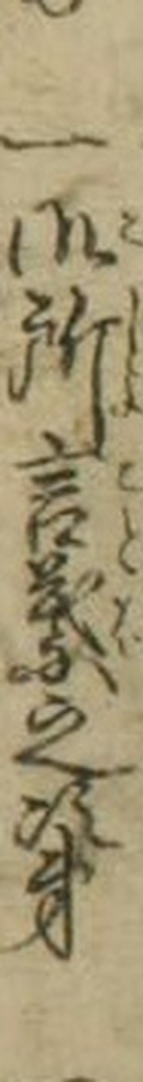一御所言葉之次第
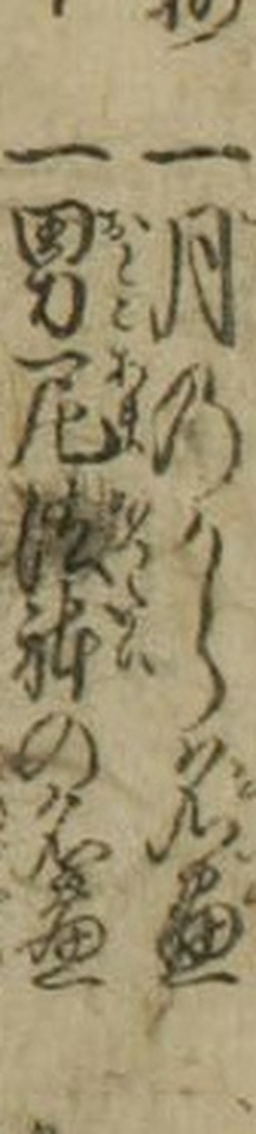一男尼法体の名尽
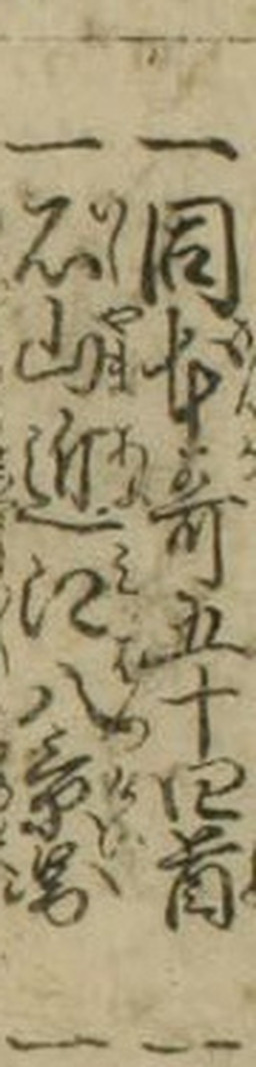一石山近江八景図
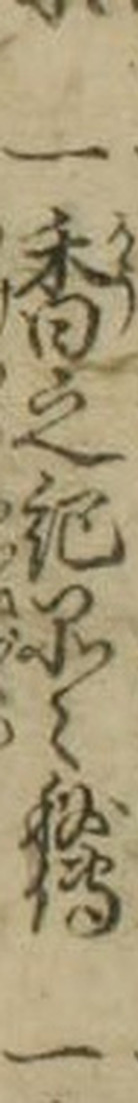一香之紀品々秘伝
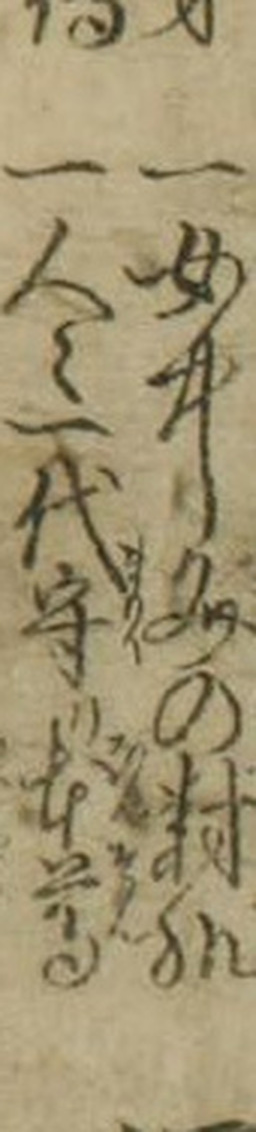一人々一代守り本尊
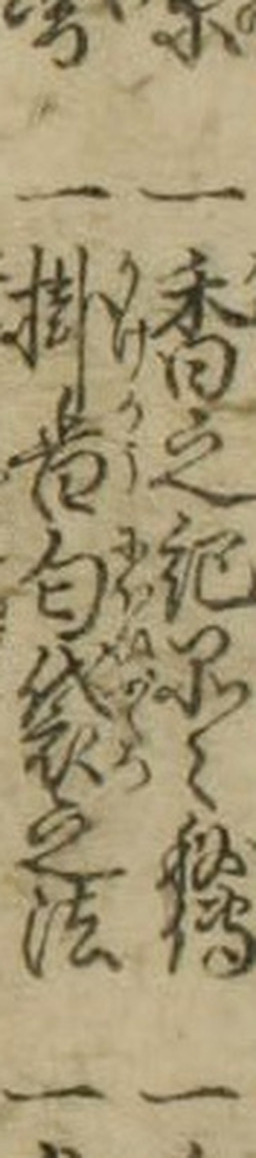一掛香匂袋之法
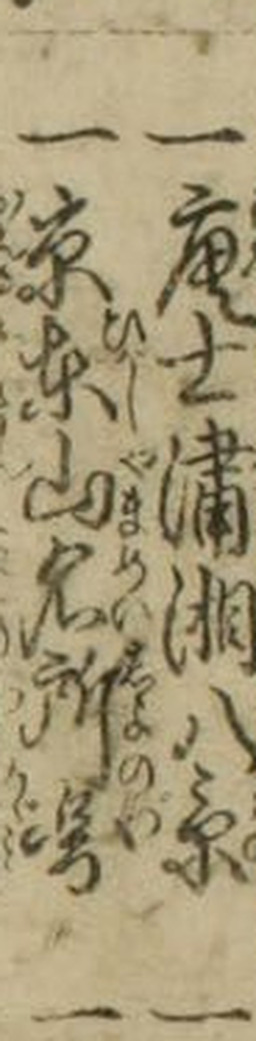一京東山名所図
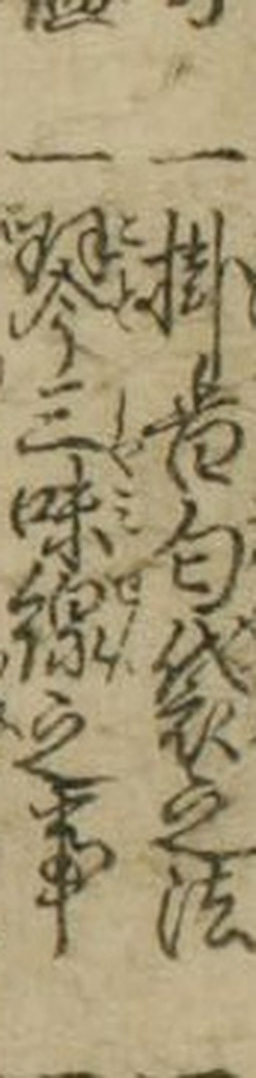一琴三味線之事
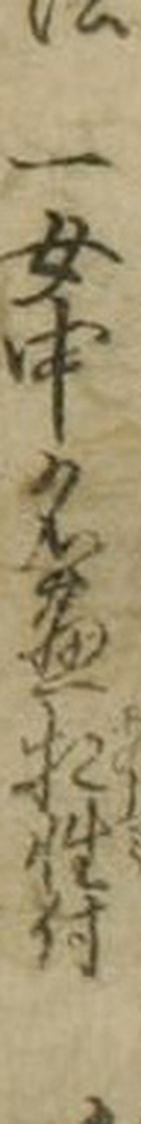一女中名尽相性付
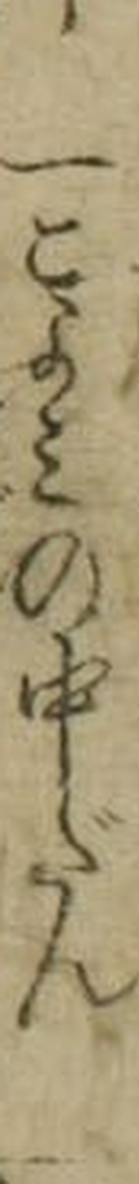一こよみの中だん
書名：女源氏教訓鑑
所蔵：東京学芸大学附属図書館
